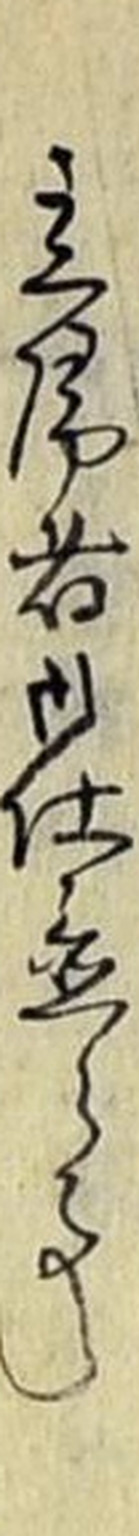立帰者御仕置之事
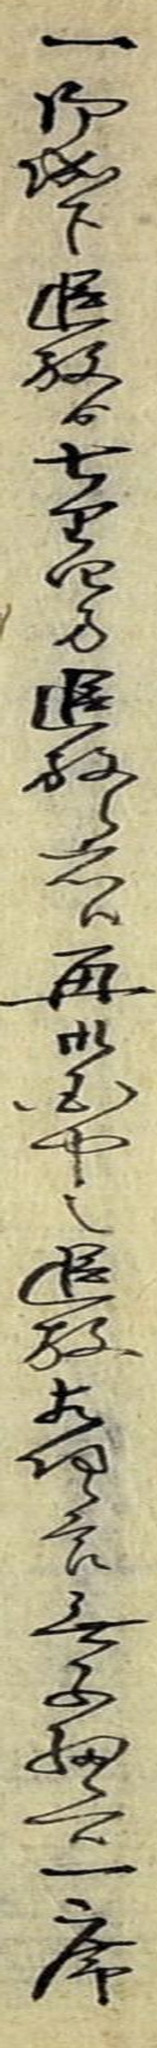一御城下追放ゟ七里四方追放之者は再御国中之追放相伺候節無子細候へは一席
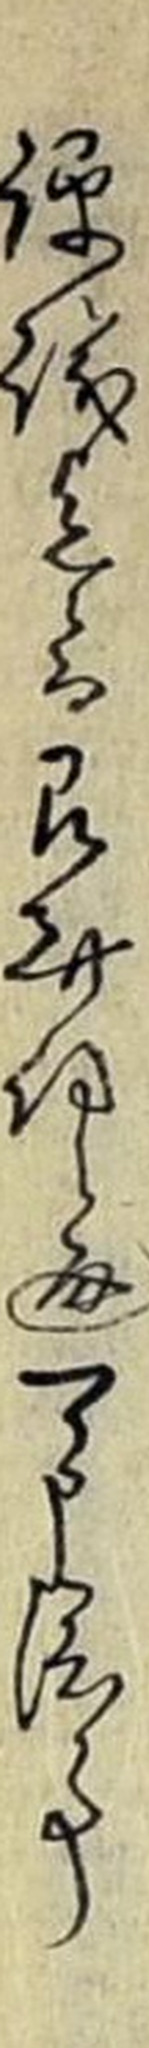評議迄に而即刻伺之通可申渡事
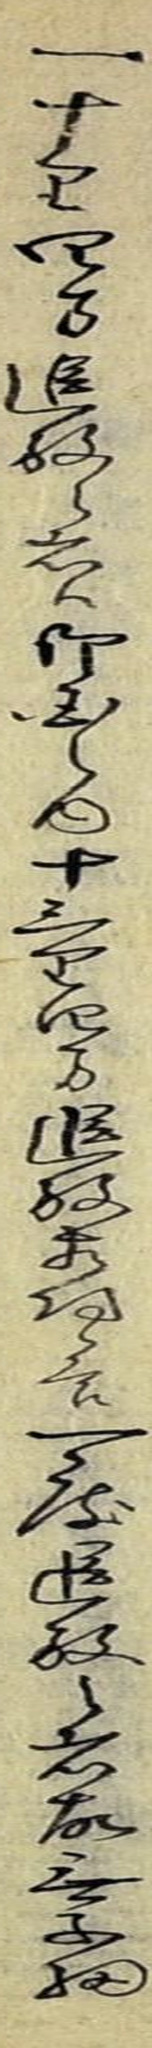一十里四方追放之者は御国之内十三里四方追放相伺候節一度追放之者故無子細
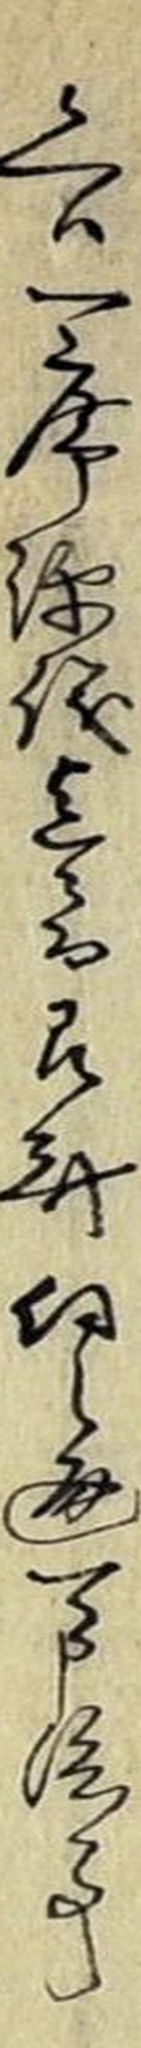候へは一席評議迄に而即刻伺之通可申渡事
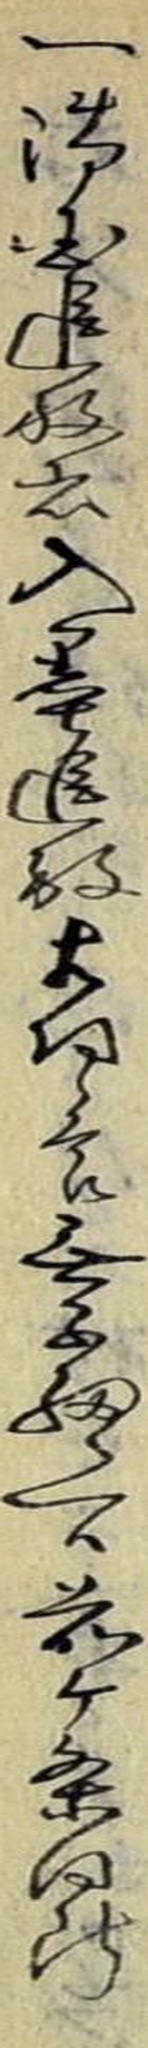一御国追放者入墨追放相伺候節無子細候へは前ヶ条同断
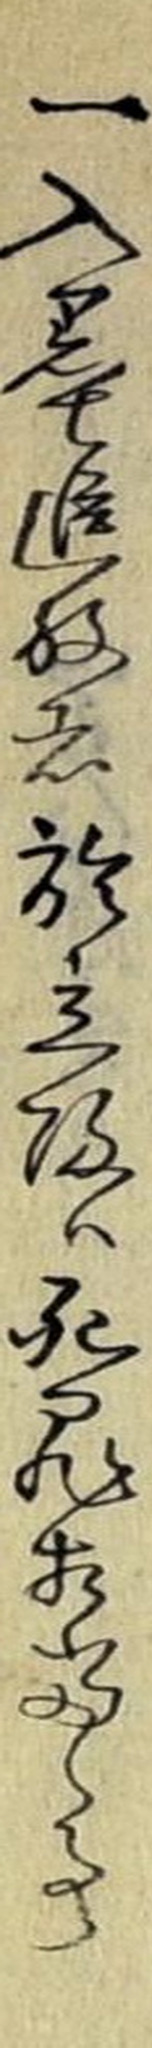一入墨追放者於立帰は死罪相当候事
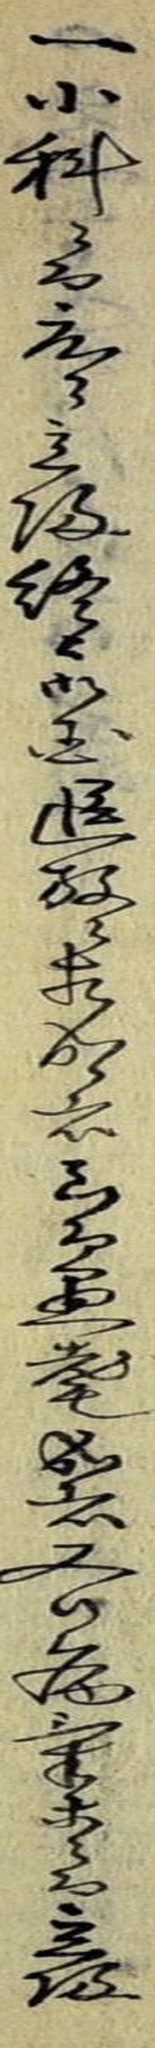一小科に而度々立帰終に御国追放に相成候者至而愚耄成者又は病気等に而立帰
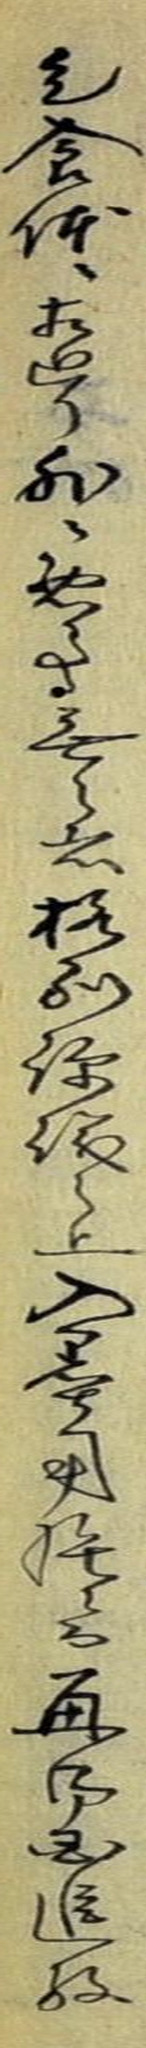乞食体へ相廻り外に悪事無之者格別評議之上入墨用捨に而再御国追放
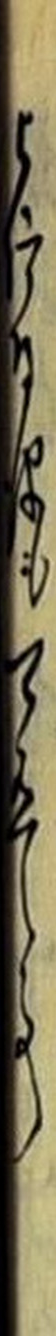被仰付儀も可有之事
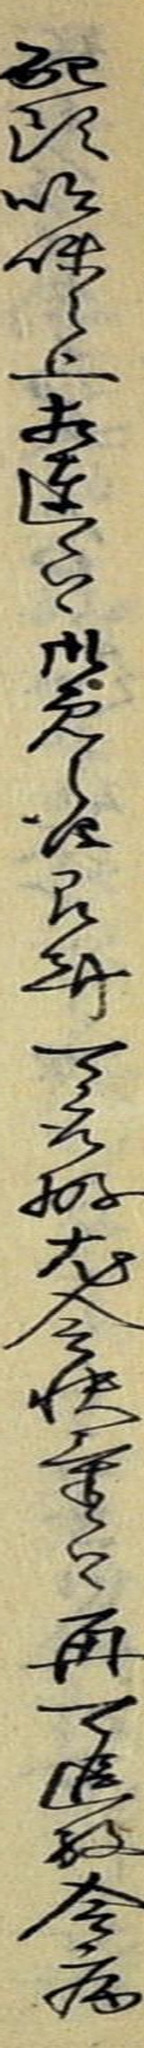配頭吟味之上相達候はヽ御免之儀即刻可取扱尤快気令候はヽ再可追放令病
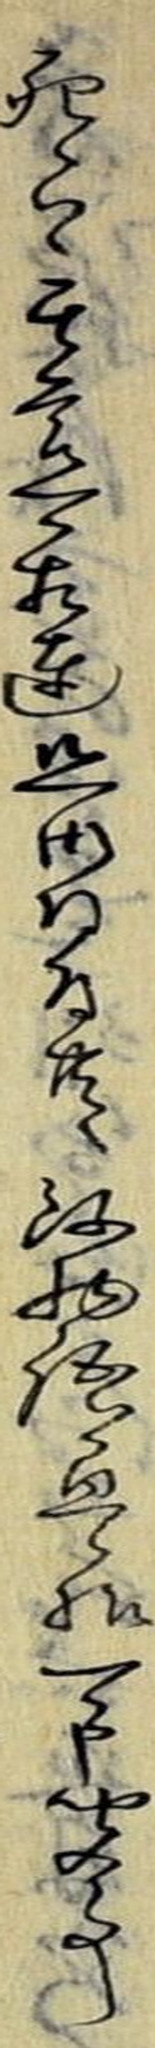死候はヽ其節可相達且御目付共へ致物語置候様可申聞事
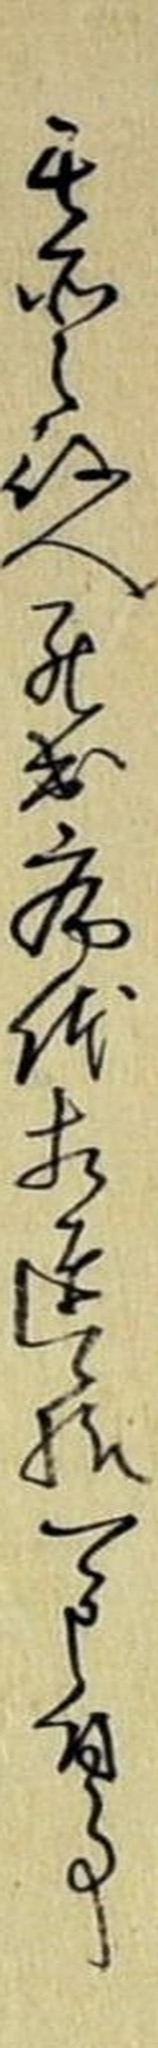其所之役人罷出病体相達候様可申付事
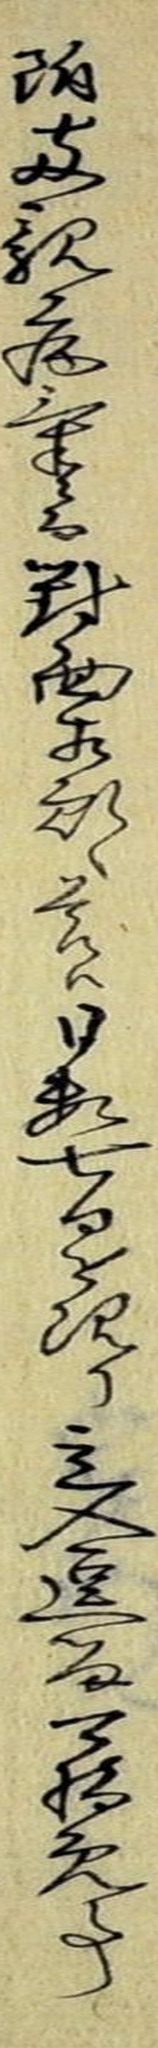附両親病気に而対面相願候節は日数七日を限り立入逗留可指免事
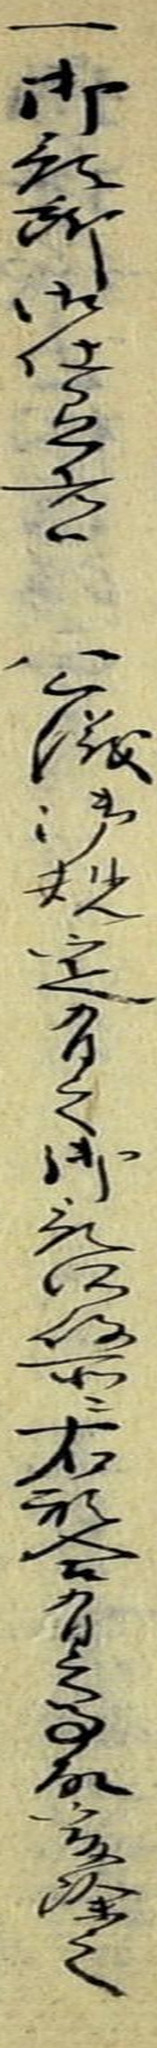一御預所御仕置方は公儀御規定有之御預所役所に右形合有之事故爰除之
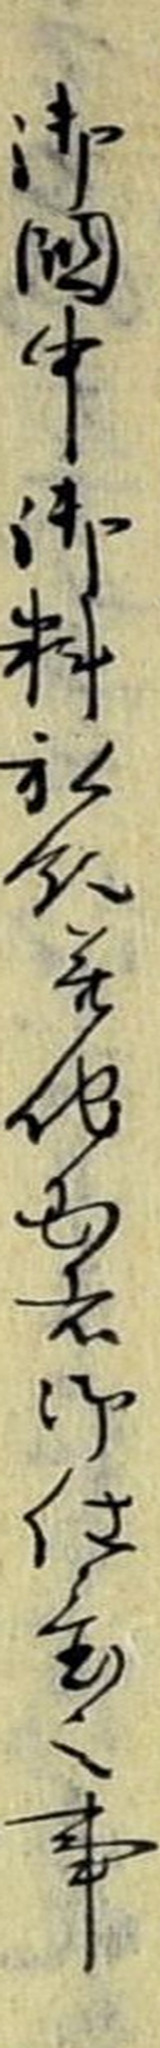御国中御料私領并他国者御仕置之事
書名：命令之部 四
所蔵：福井県文書館 Fukui Prefectural Archives
